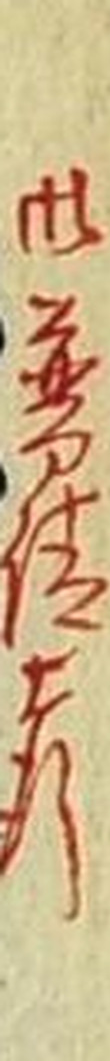御普請奉行
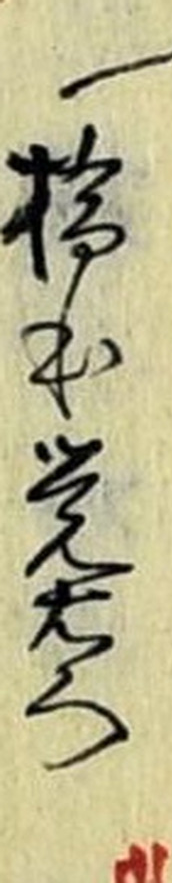橋本覚右衛門
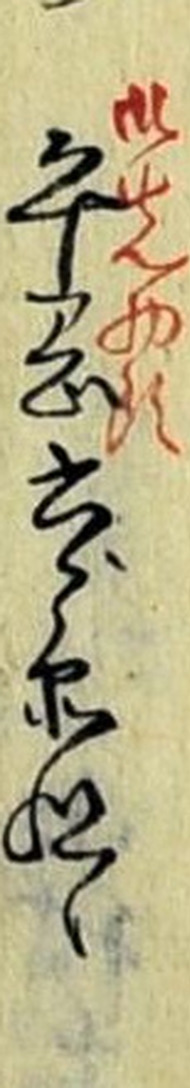平岡六郎兵衛組へ
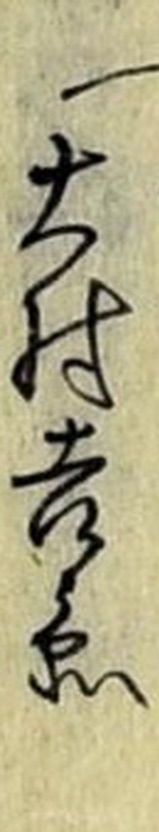大村吉兵衛
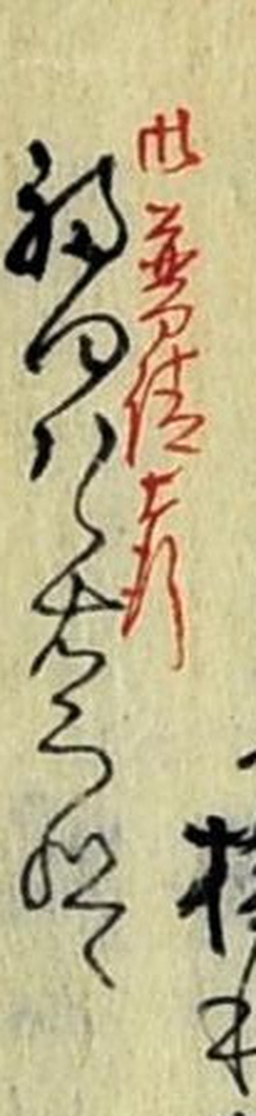福田八郎右衛門組へ
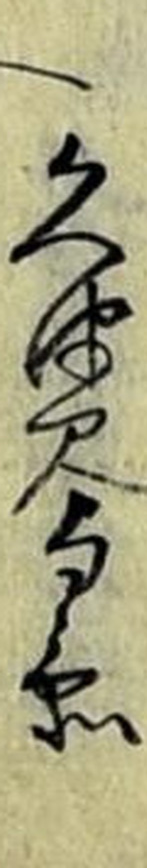久津見与兵衛
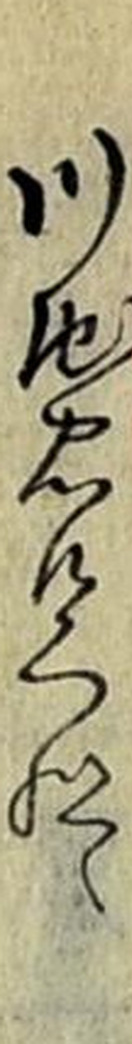川地忠左衛門組へ
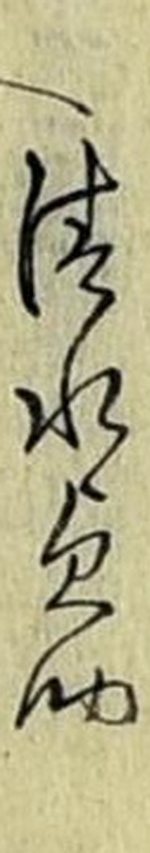清水貞助
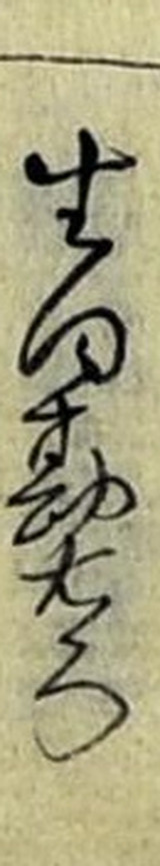生田勘右衛門
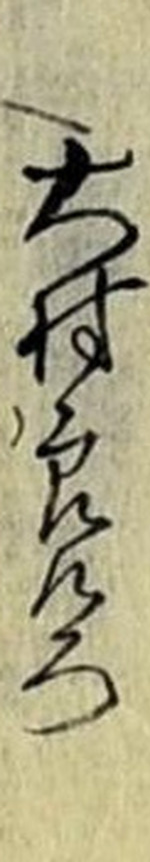大村官左衛門
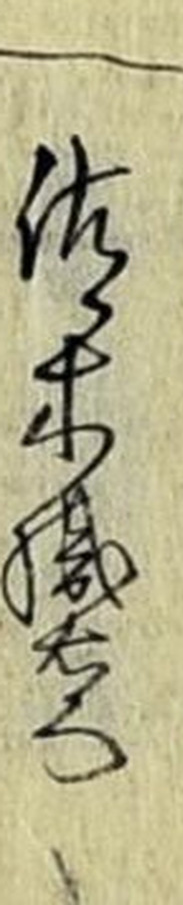佐々木織右衛門
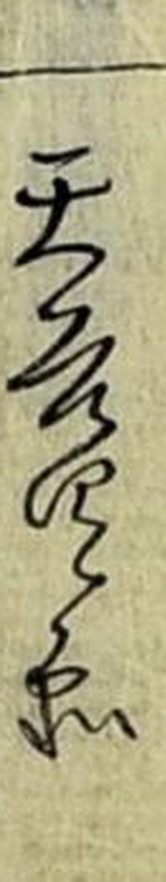天谷四郎兵衛
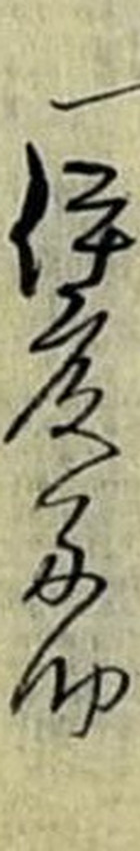伊藤多助
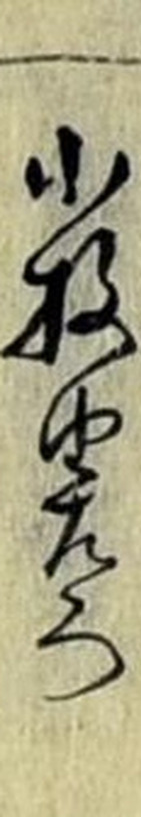小牧由左衛門
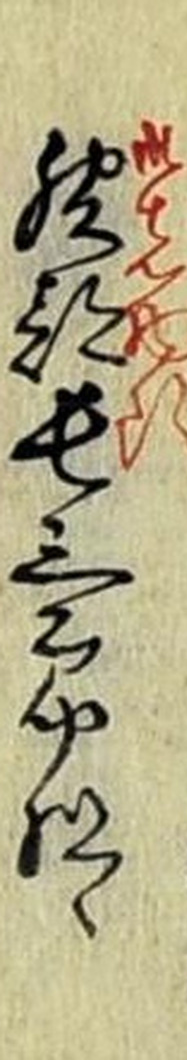服部長三郎組へ
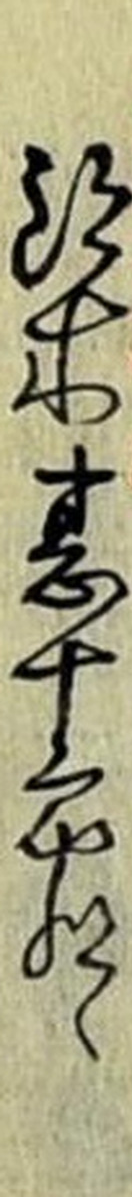鈴木甚十郎組へ
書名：命令之部 四
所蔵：福井県文書館 Fukui Prefectural Archives
